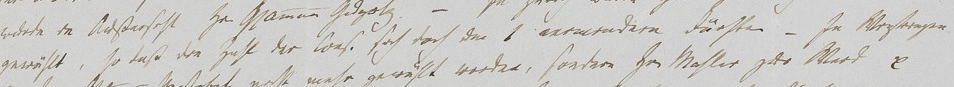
gewählt, so daß die Zahl der Cons. sich doch um 1 vermindern dürfte. – In Wipkingen
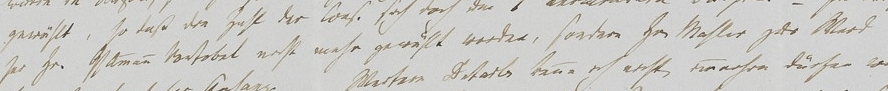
sei Hr. GAmmann Vontobel nicht mehr gewählt worden, sondern Hr. Mahler zur Werd &
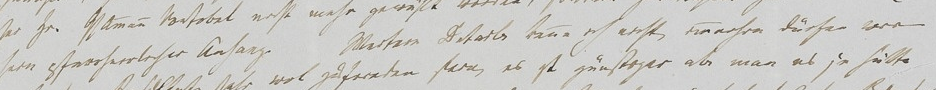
sein pfarrherrlicher Anhang. Weitere Details kenne ich nicht, immerhin dürfen wir
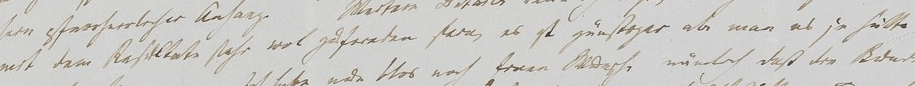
mit dem Resultate sehr wol zufrieden sein, es ist günstiger als man es je hätte
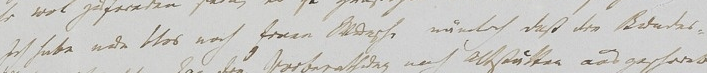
Ich habe nun blos noch Einen Wunsch, nämlich daß die Bundes-
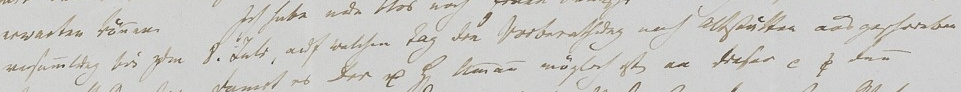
versammlung bis zum 8. Juli, auf welchen Tag die Vorberathung nach Altstätten ausgeschrieben
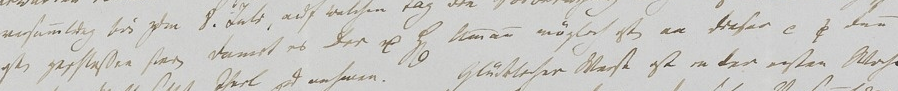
ist, geschlossen sei, damit es Dir & Herrn Ammann möglich ist an dieser & dann
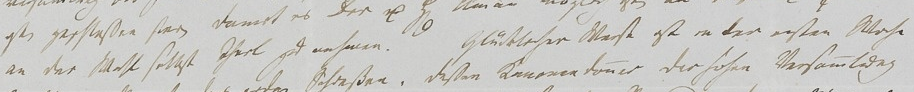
an der Wahl selbst Theil zu nehmen. Glücklicher Weise ist in der ersten Woche
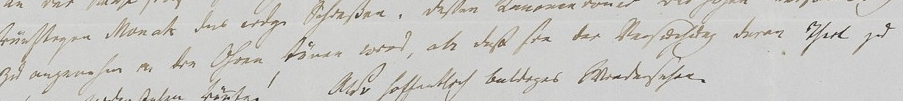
zu agenehm in die Ohnren tönen wird, als daß sie der Versuchung daran Theil zu
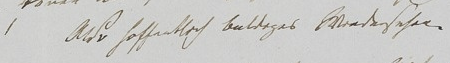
Also hoffentlich baldiges Widersehen.
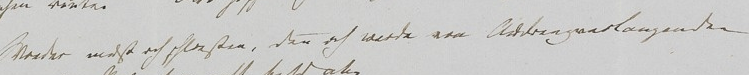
Wieder muß ich schließen, denn ich werde von Audienzverlangenden
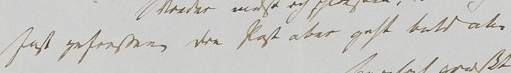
fast gefressen, die Post aber geht bald ab.
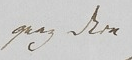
ganz Dein
